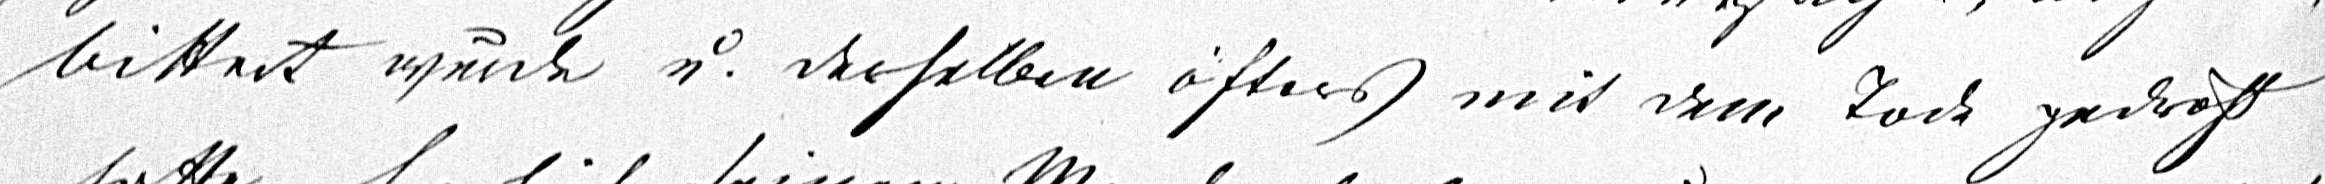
bittert wurde u. derselben öfters mit dem Tode gedroht
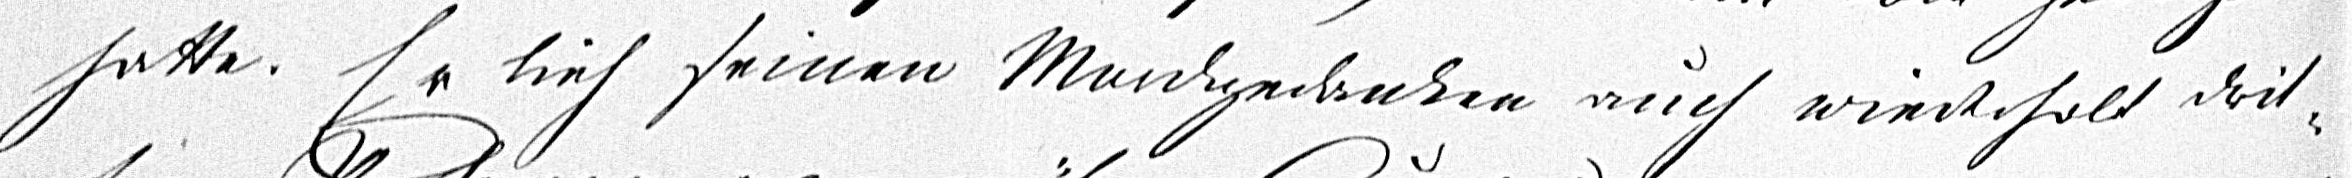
hatte. Er lieh seinen Mordgedanken auch wiederholt drit¬
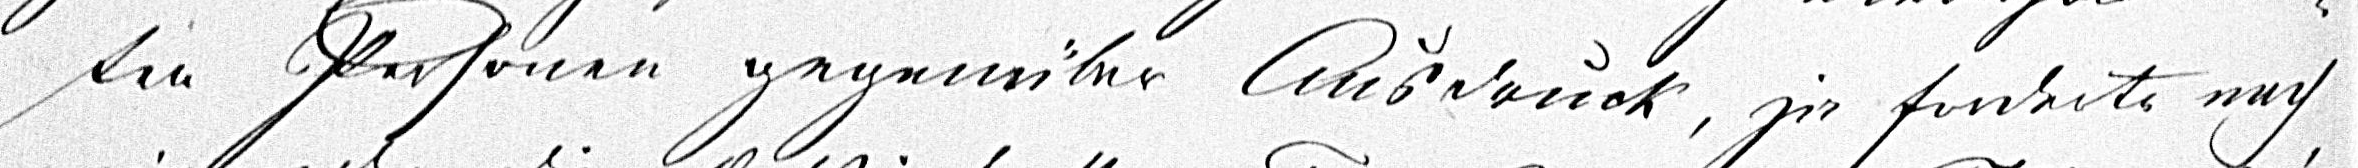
ten Personen gegenüber Ausdruck, ja forderte nach
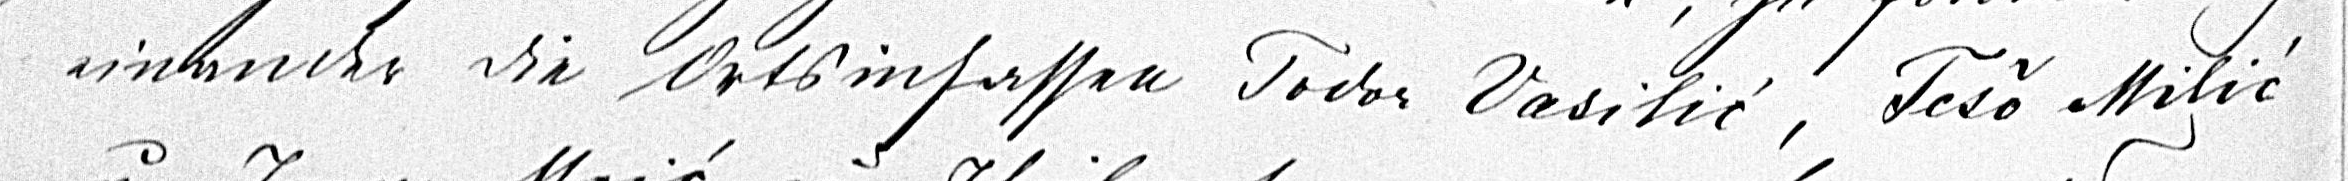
einander die Ortsinsassen Todor Vasilić, Teso Milić
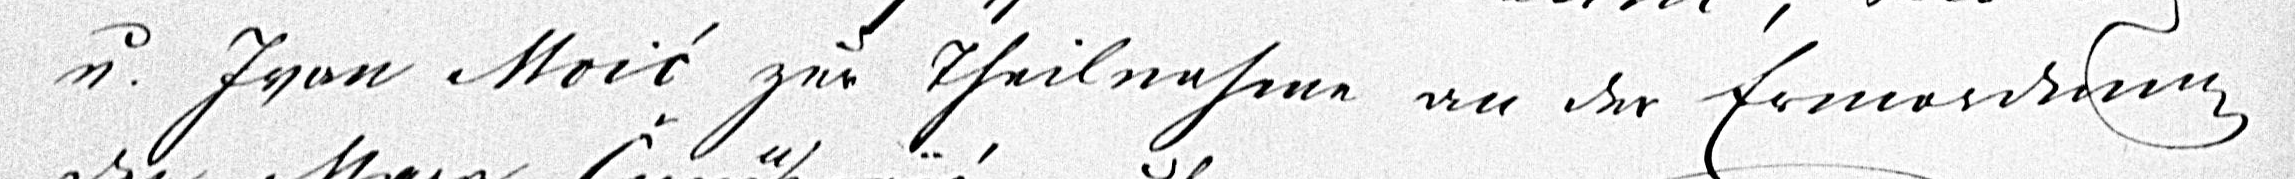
u. Ivan Moić zur Theilnahme an der Ermordung
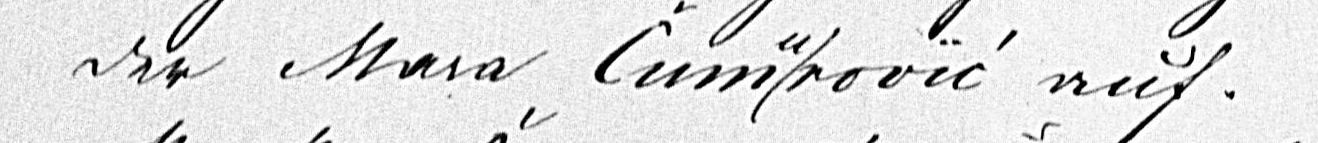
der Mara Cumurović auf.
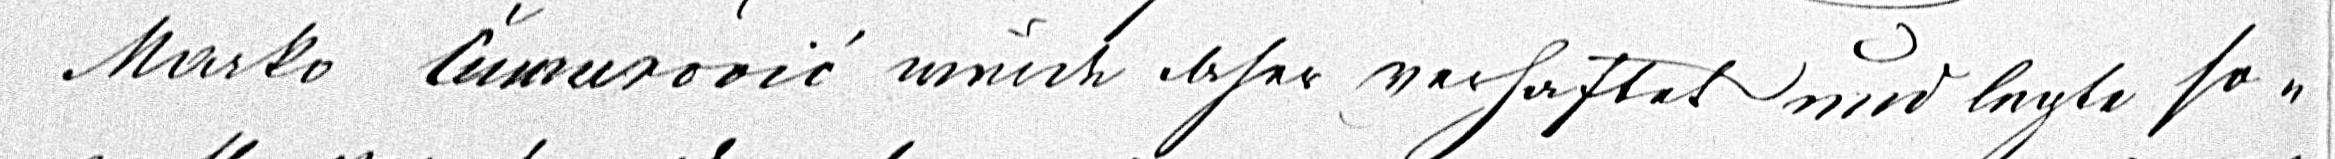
Marko Cumurović wurde daher verhaftet und legte so¬
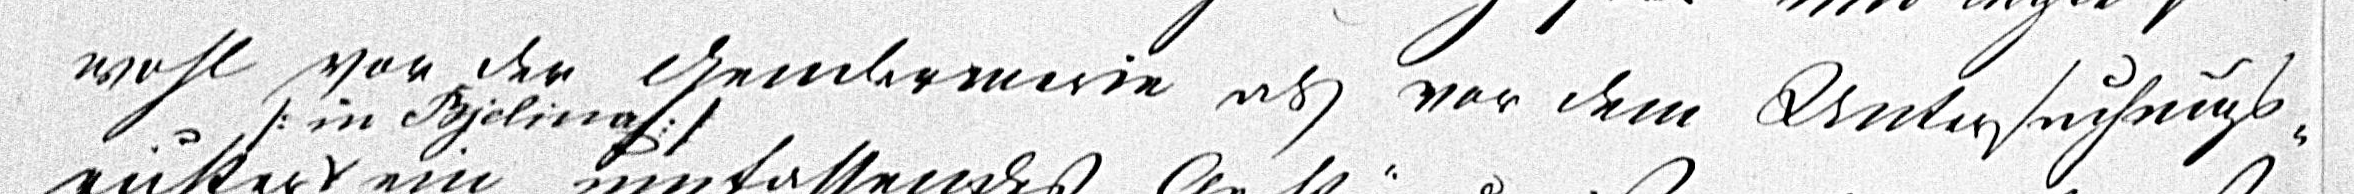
wohl von der Gendarmerie es vor dem Untersuchungs¬
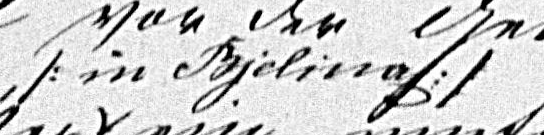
/:in Bjelina:/
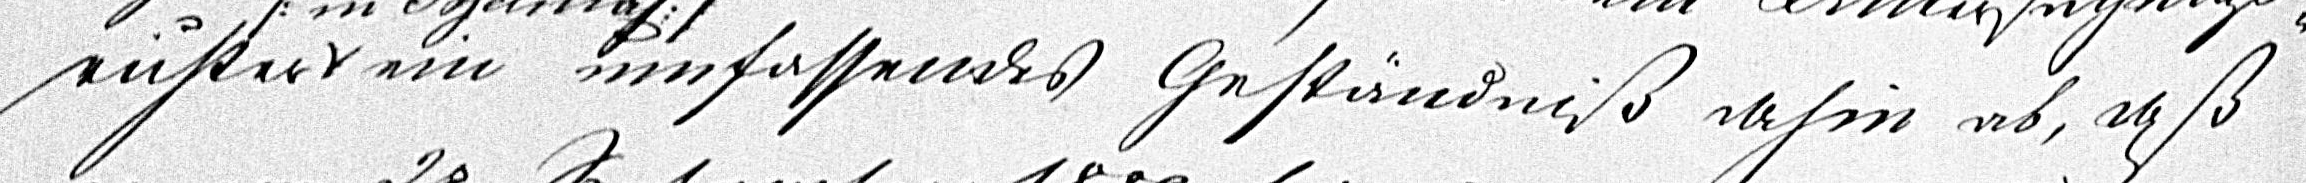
richter ein umfassendes Geständniß dahin ab, daß
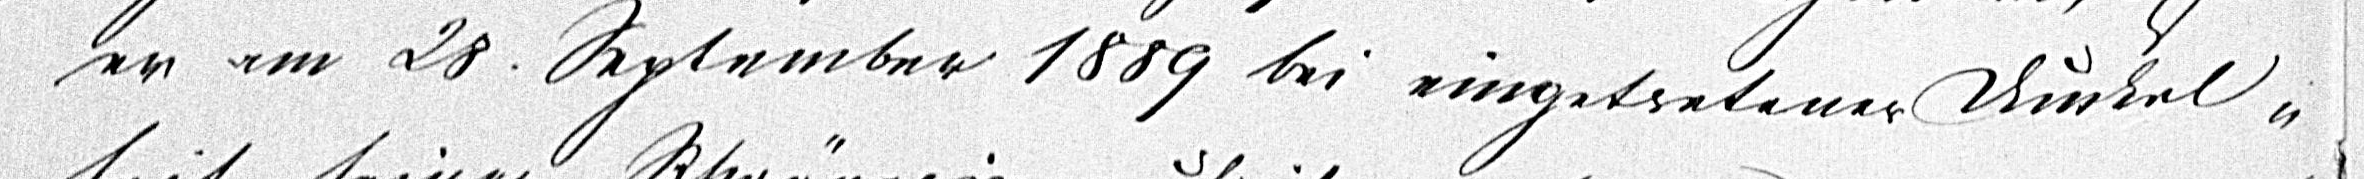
er am 28. September 1889 bei eingetretener Dunkel¬
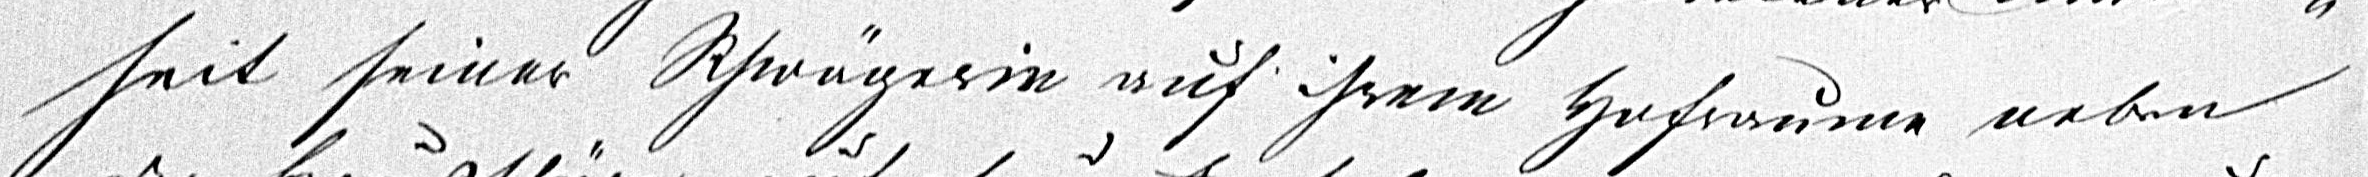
heit seiner Schwäger auf ihrem Hofraume neben
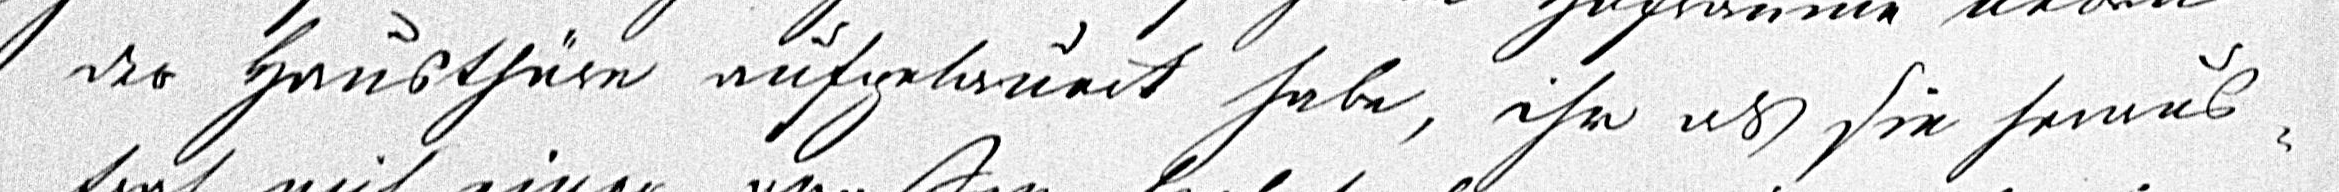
der Hausthüre aufgelauert habe, ihr es sie heraus¬
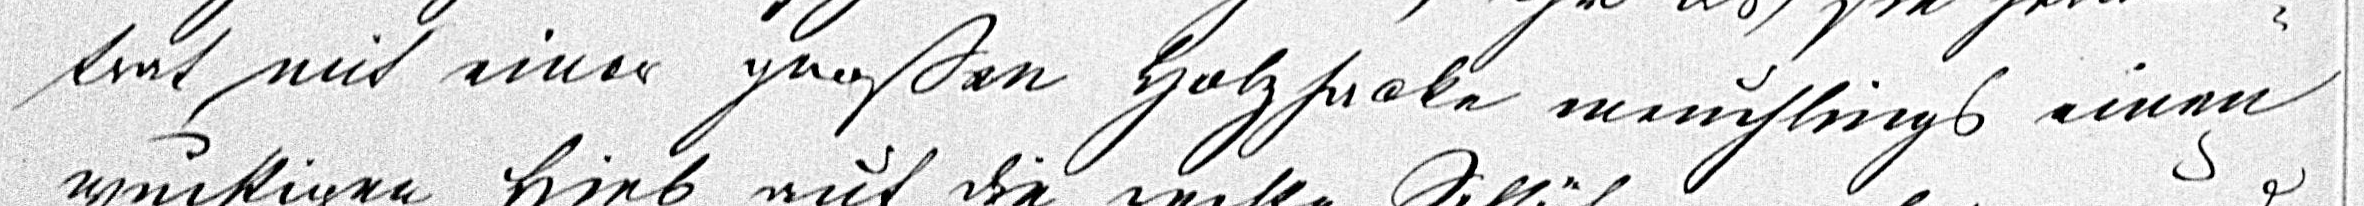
trat mit einer großen Holzhacke meuchlings einen
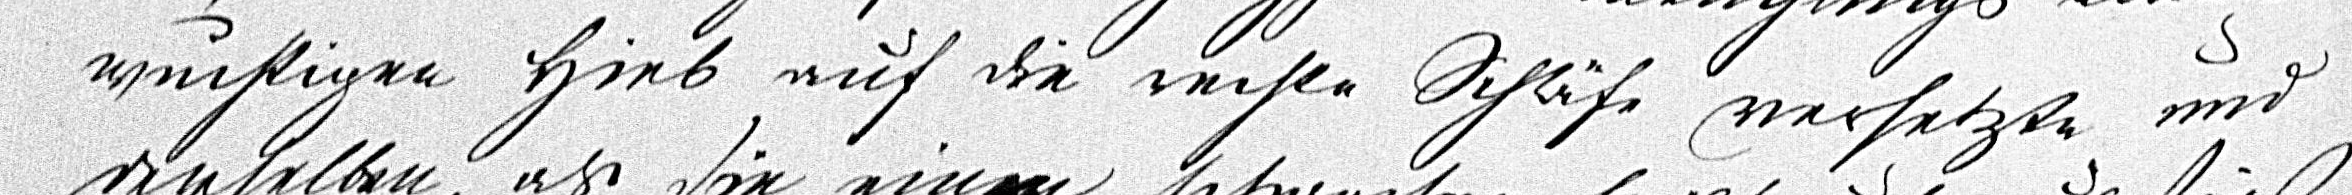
wuchtigen Hieb auf die rechte Schläfe versetzte und
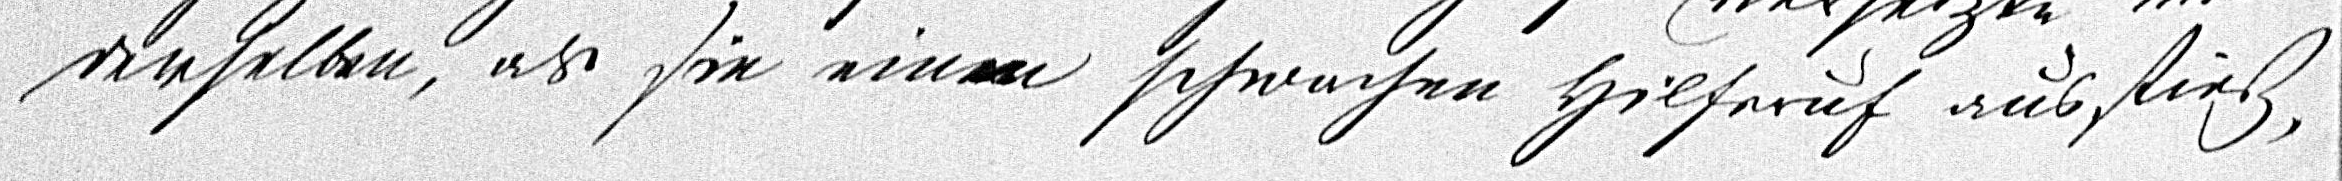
derselben, als sie einen schwochen Hilferuf ausstieß,
